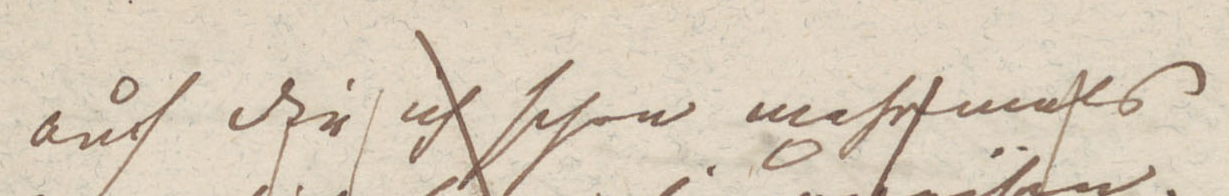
auf die ich schon mehrmals
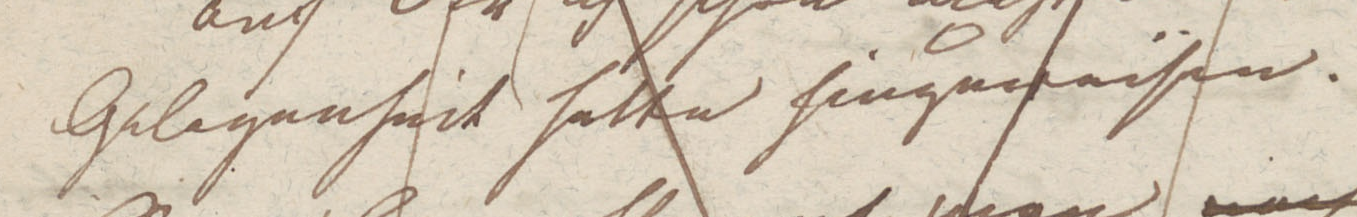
Gelegenheit hatte hinzuweisen.
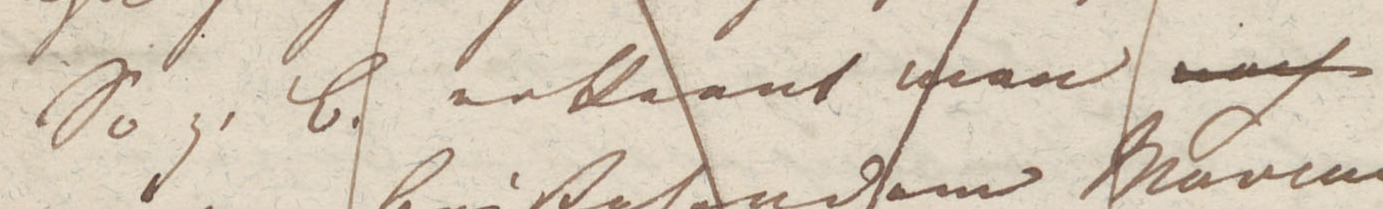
So z.B. erkennt man noch
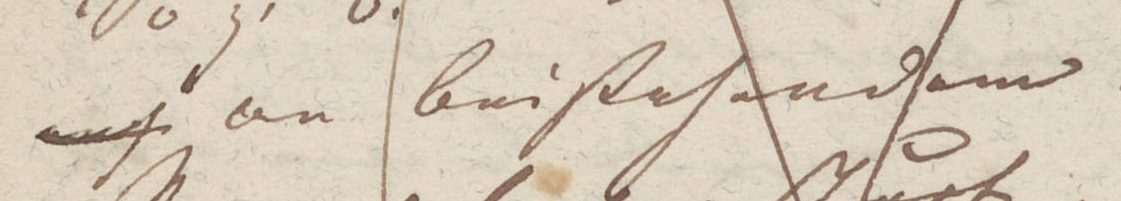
aus an beistehendem
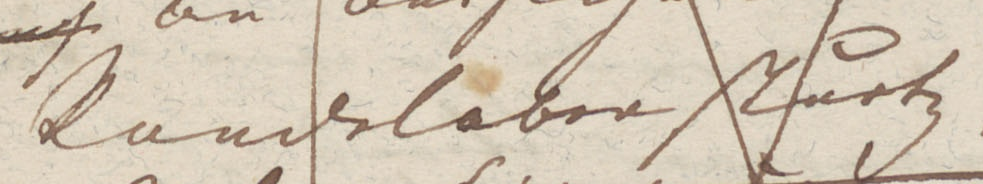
kandelabersturtz,
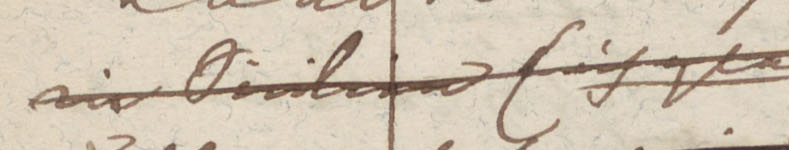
in Sicilien (ich glaube
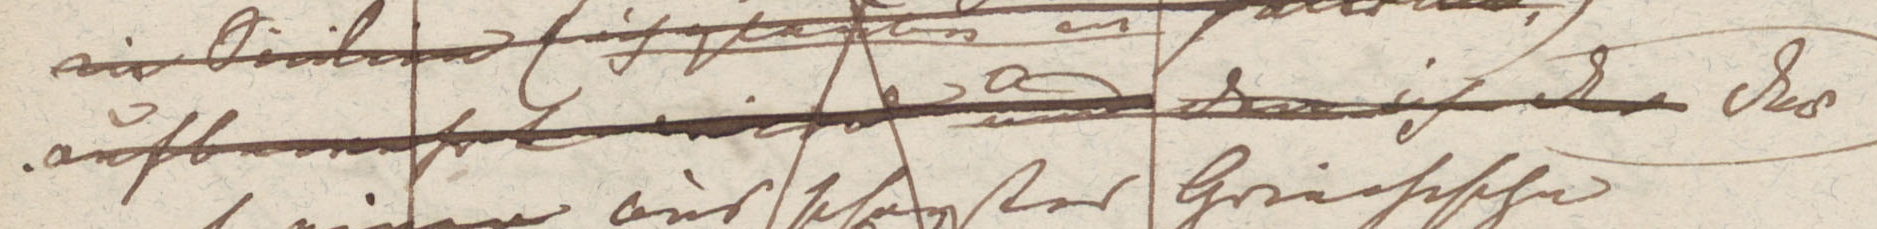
aufbewahrt wird und den ich der der
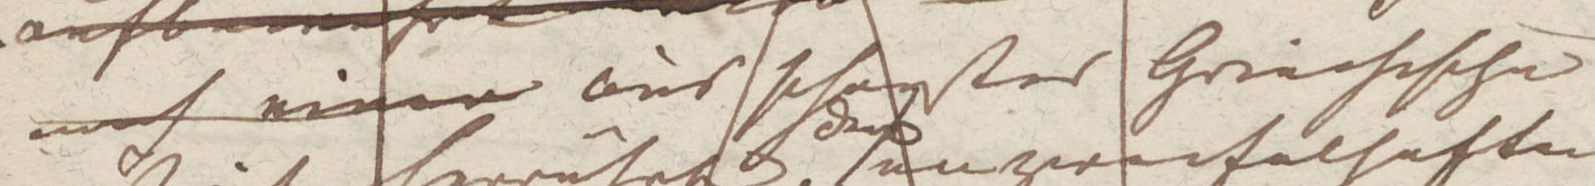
nach einer aus schonster Griechische
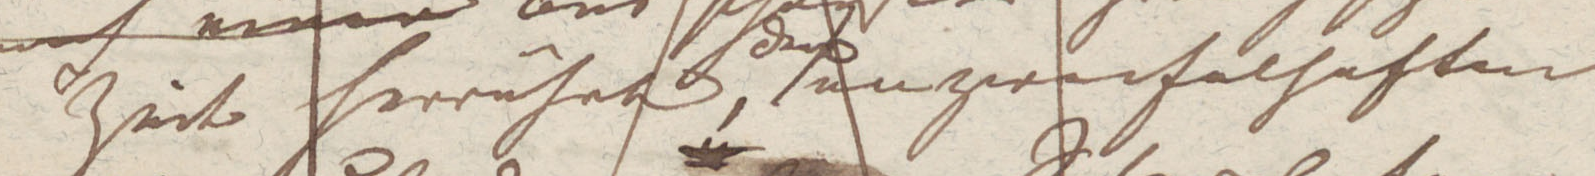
Zeit herrührt, den unzweifelhaften
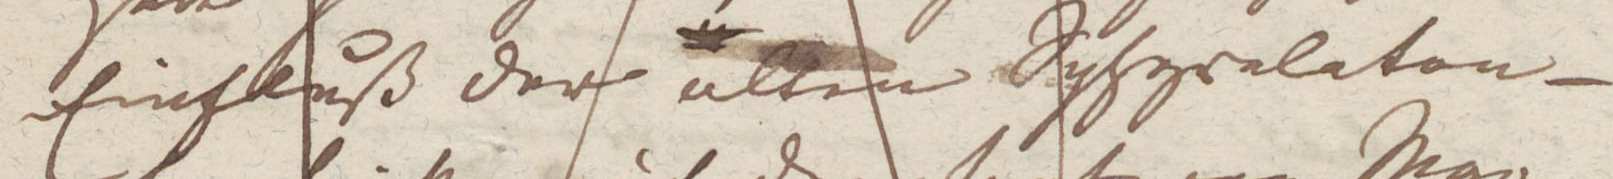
Einfluss der äalten Sphyrelaton-
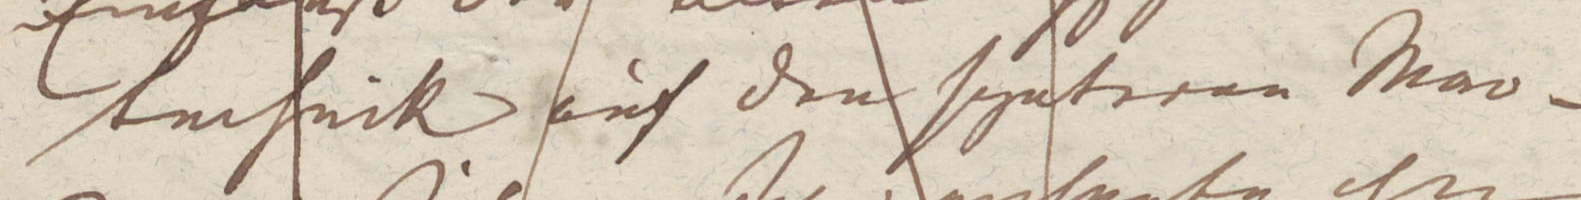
technik auf den spateren Mar-
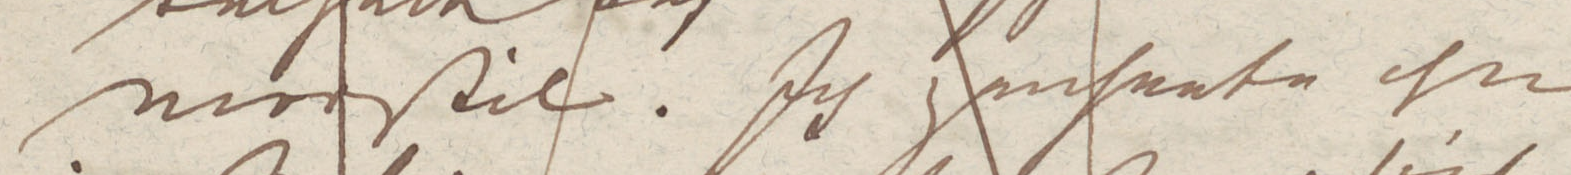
morstil. Ich zeichnete ihn
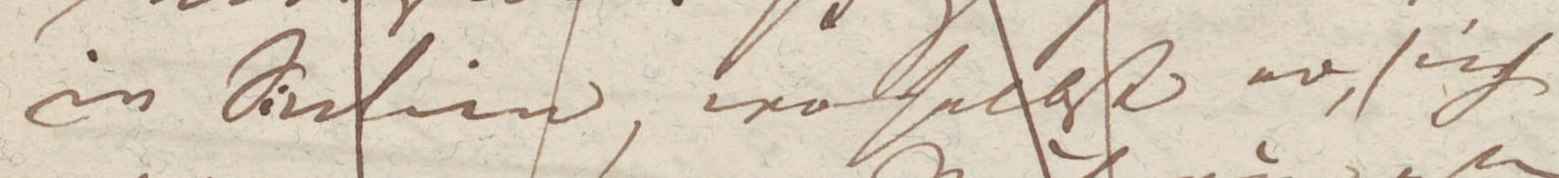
in Sicilien, woselbst er, (ich
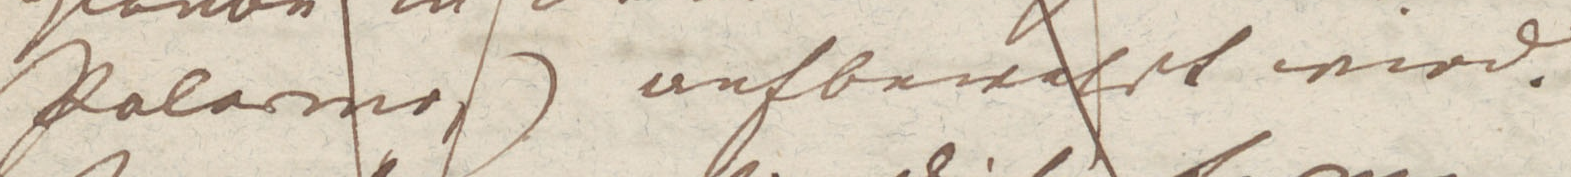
Palermo,) aufbewahrt wird.
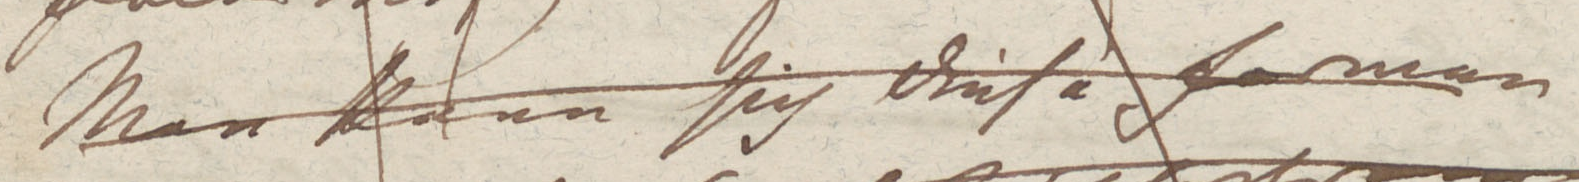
Man kann sich diese Formen
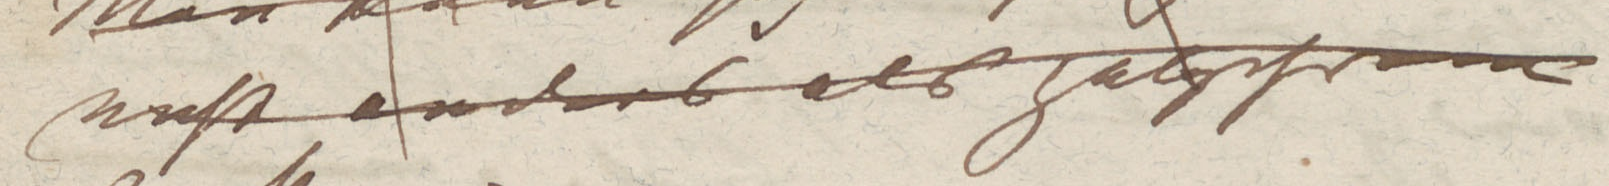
nicht anders als polychrom
